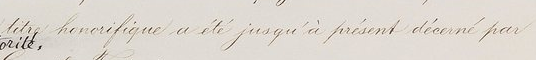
titre honorifique a été jusqu'à présent décerné par
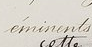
Conseil Tessinois.
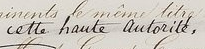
cette haute Autorité.
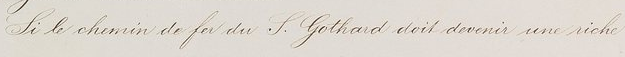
Si le chemin du fer du S.Gothard doit devenir une riche
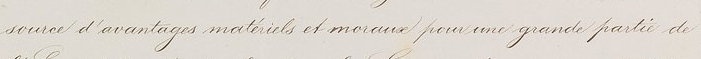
source d'avantages matériels et moraux pour une grande partie de
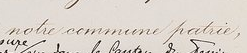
Suisse, notre commune patrie,
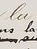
plus vrai
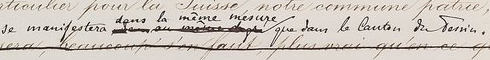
au même degré dans la même mesure que dans
